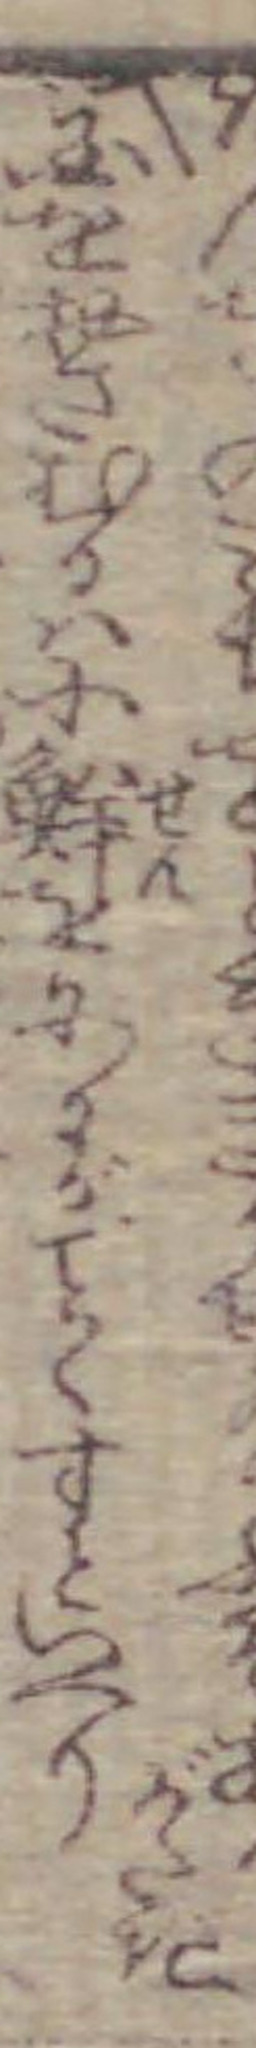〽国をおさむるは小鮮をにるがごとくすといへり
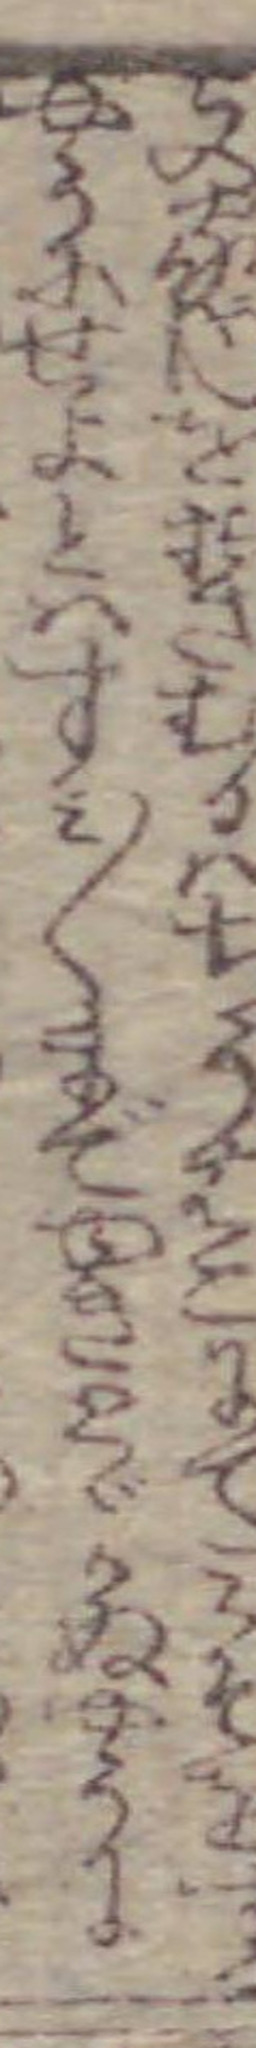やうにせよとはすみ〳〵までゆきとゞかぬやうに
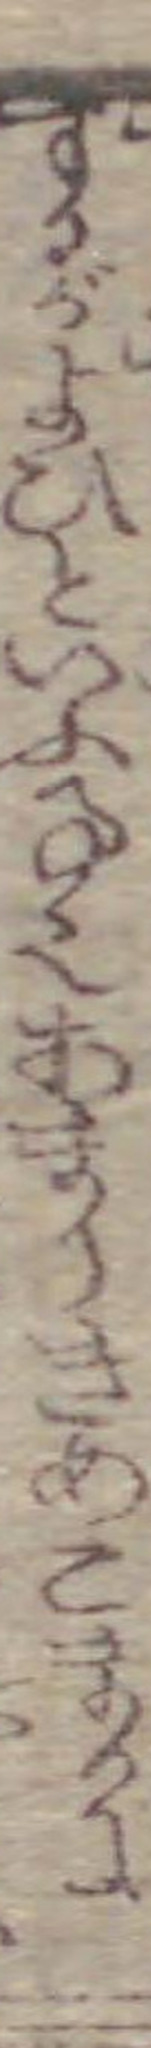するがよひといふ事也あまりきめこまかに
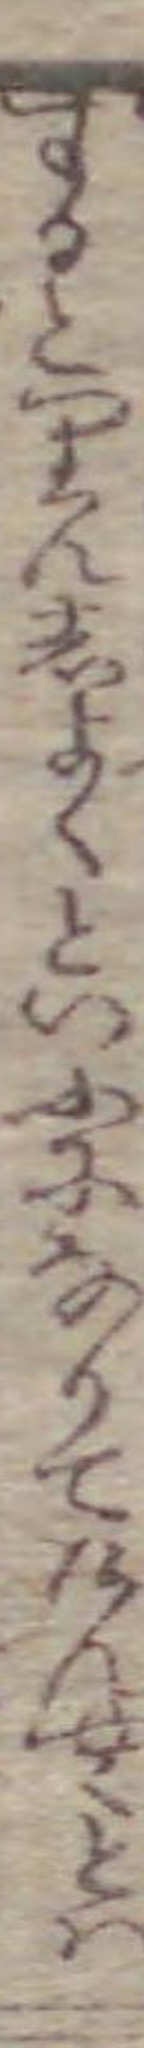するとりんしよくといふになりてけんやくとは
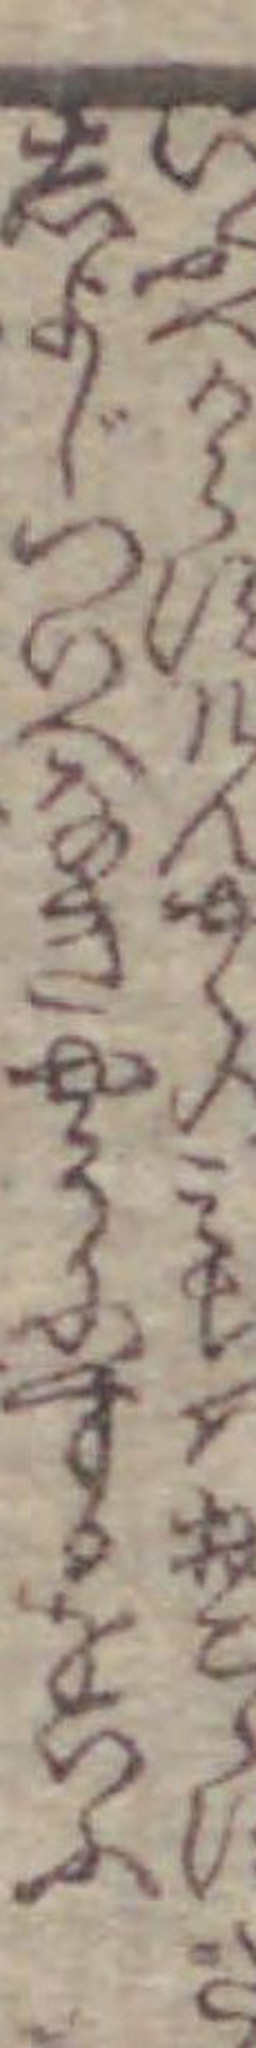しよじついへなきやうにするをいふ
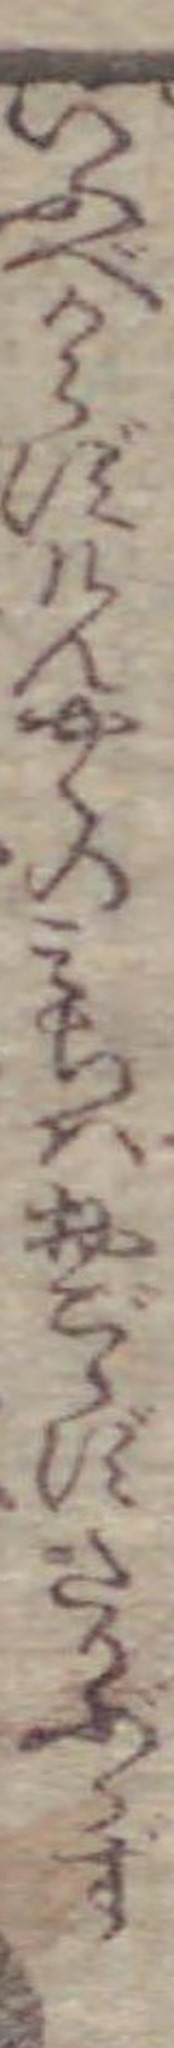いふべからずけんやくのみちはおごらずたかぶらず
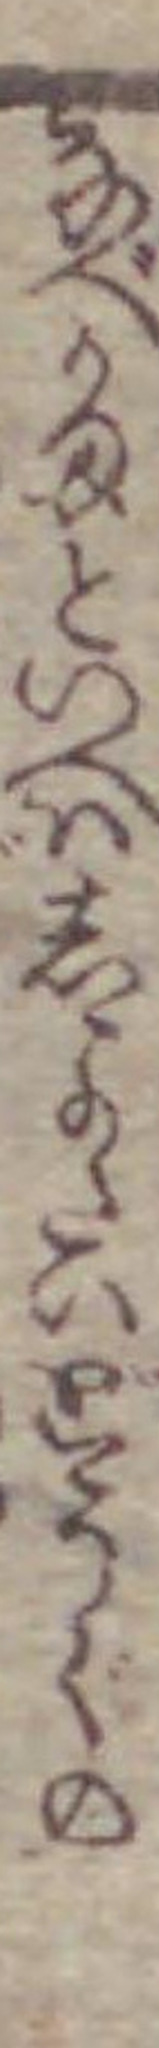なべかまといへはしよたいどうぐの
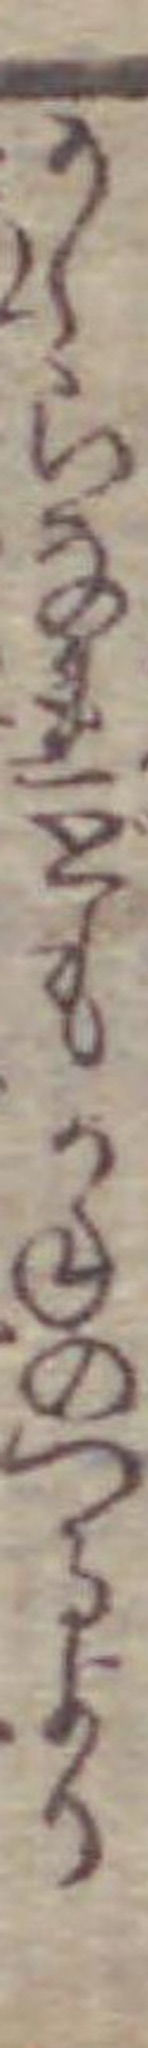かしらなれどもかねのつるより
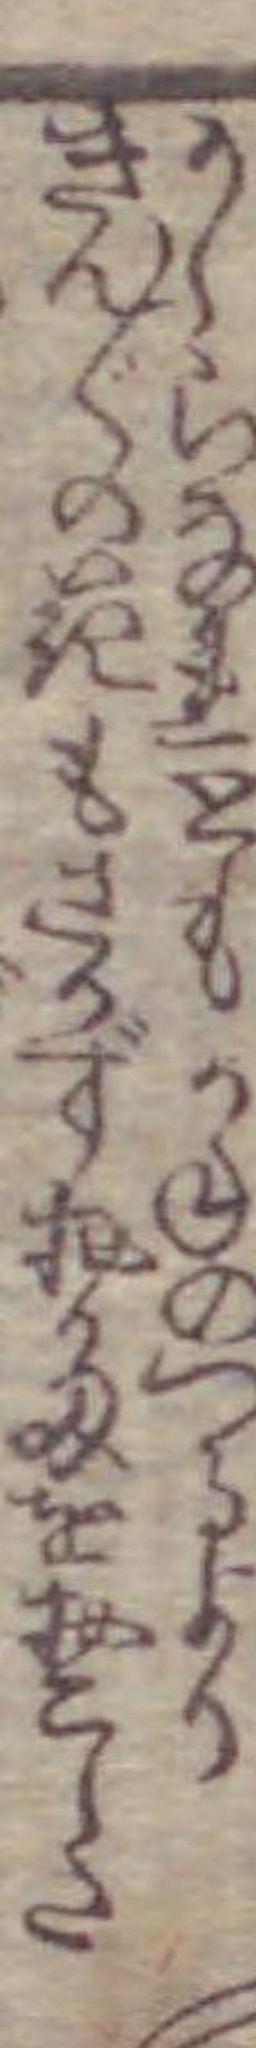きん〴〵の花もさかずおかまをおこした
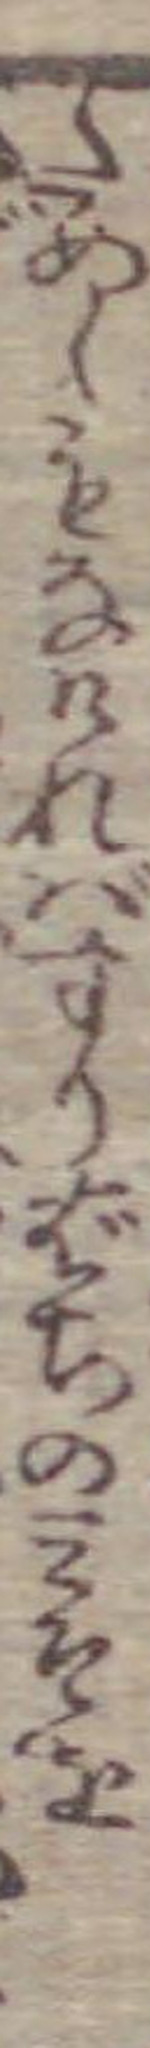ためしもなければすりばちのみそを
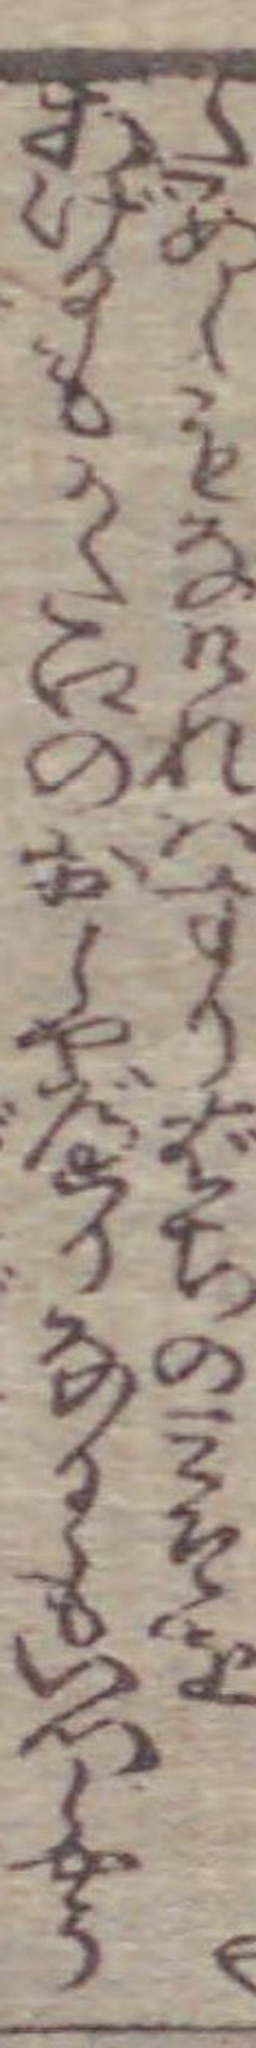あげるもかた口のおしやべりなるもいつしやう
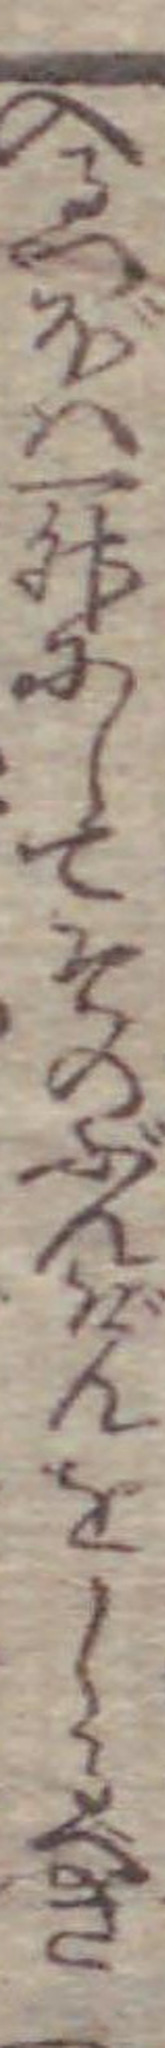入るつぼは一升にしてそのぶんげんをしるへき
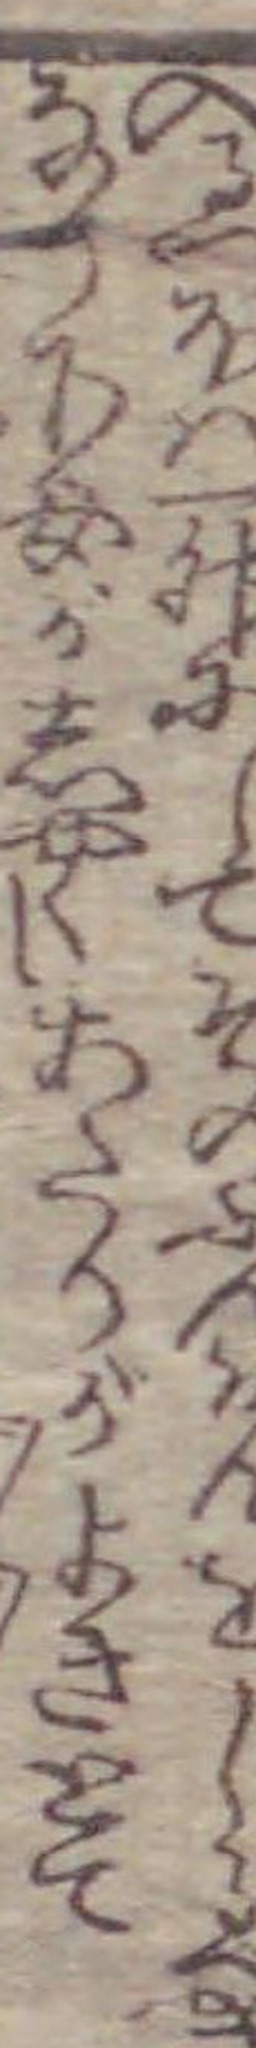なり下女がしやくしあたりがよきとて
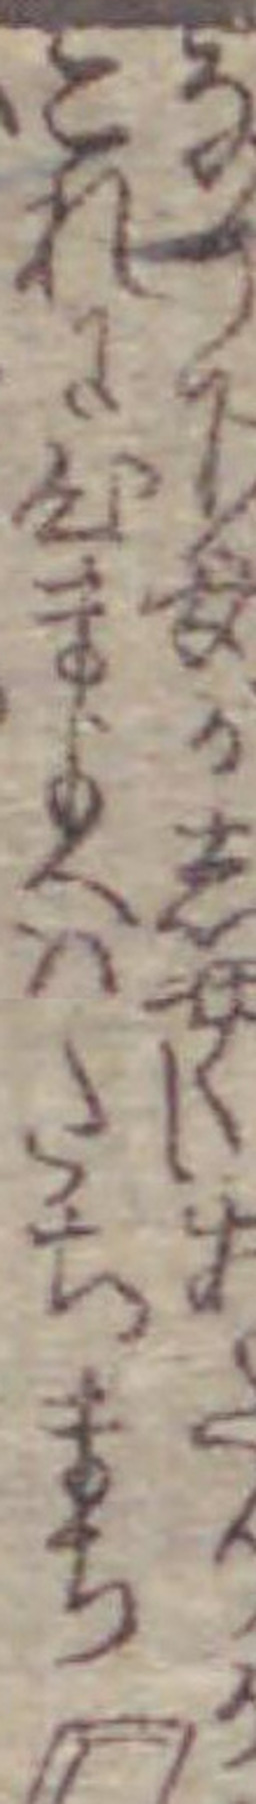これに心まよへはたちまち
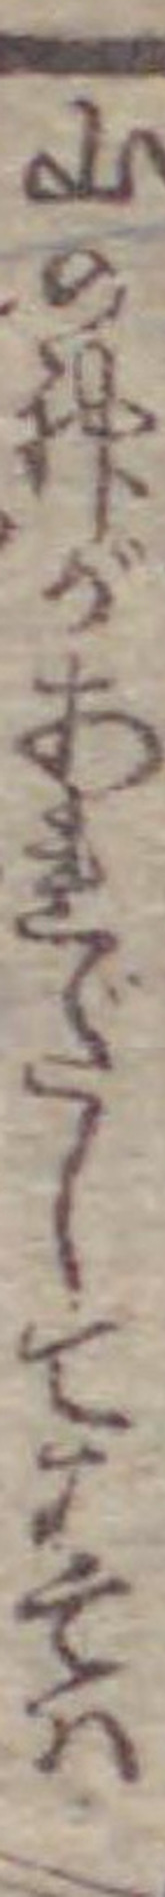山の神があれだしてはては
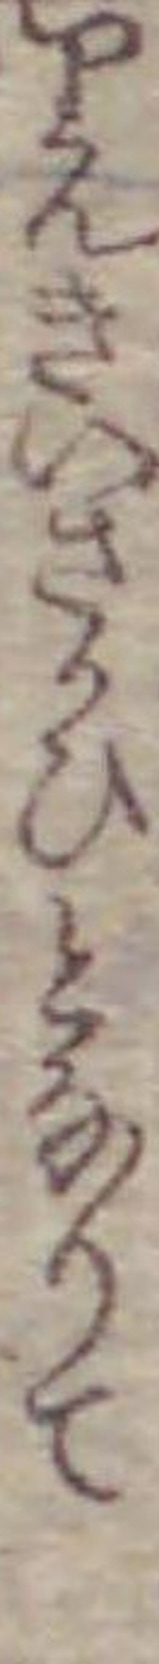りんきいさかひとなりて
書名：【保留】万物小遣帳 : 2巻（国会）
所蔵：国立国会図書館 National Diet Library, JAPAN
